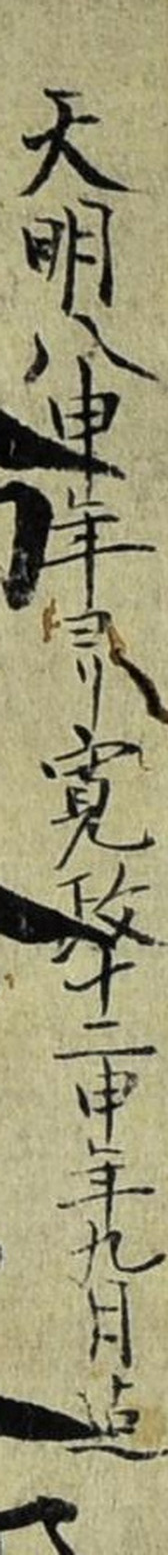天明八申年ヨリ寛政十二申年九月迄

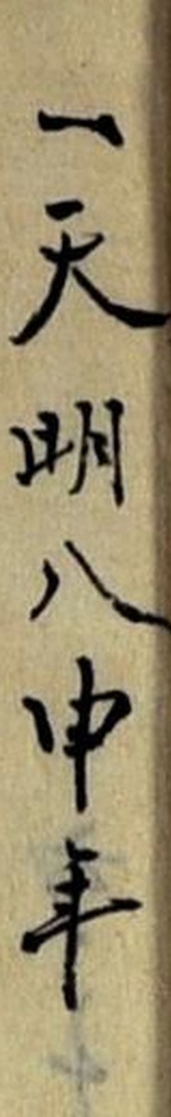一天明八申年
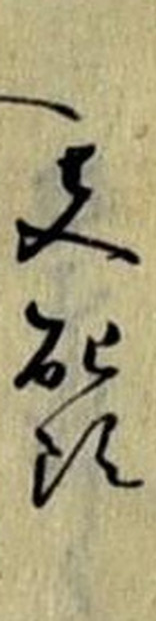支配頭
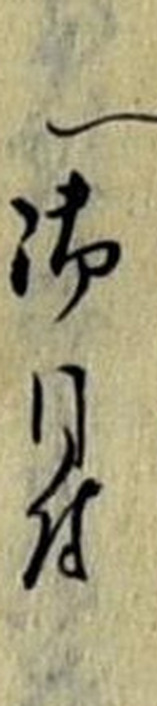御目付
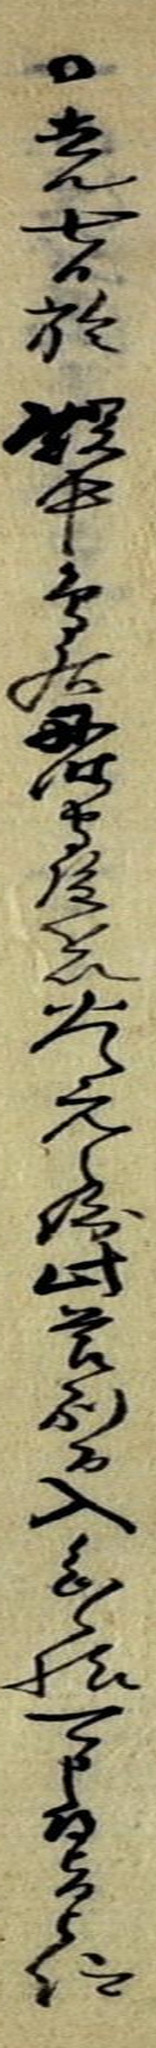○去ル七日於殿中鳥居丹波守殿を以火之元之儀此節別而入念候様可申付旨被仰
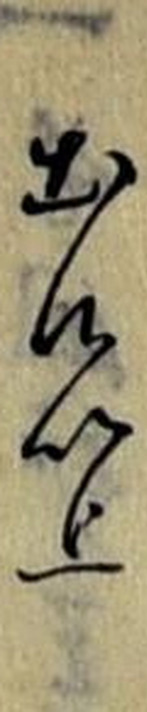出候以上
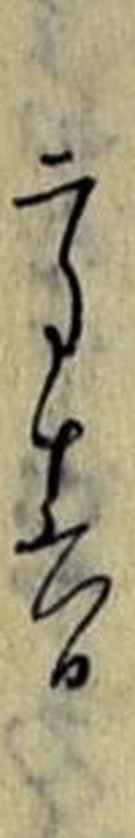三月十一日
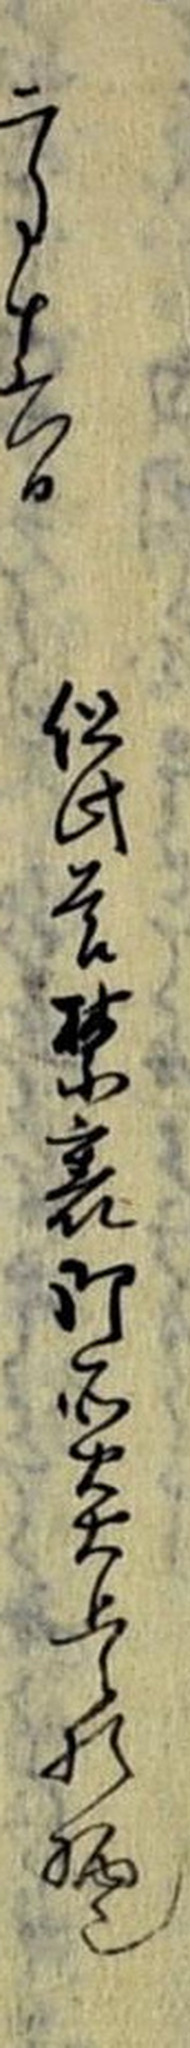二月十六日但此節禁裏御所炎上之折柄也
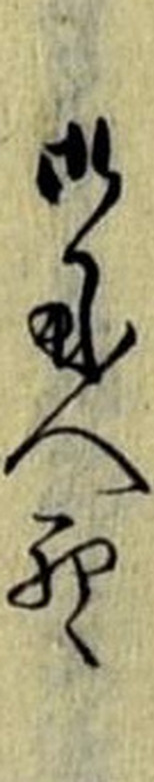御用人初へ
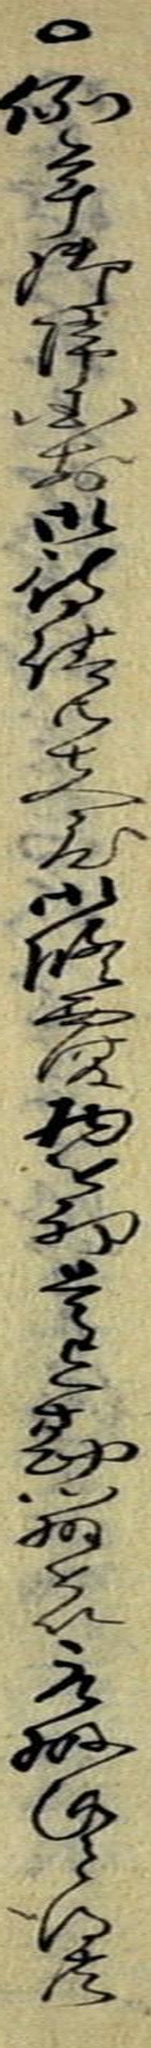○例年御帰国前御待請共支度御修覆物を初是迄勘弁を以取扱趣ニ候得共
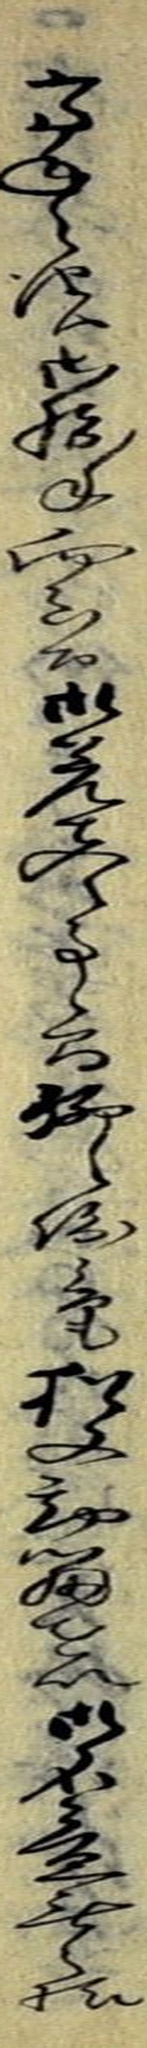当年之儀ハ御勝手向至而御差支之事候間聊之儀ニ而も猶又勘弁を以御不益無之様
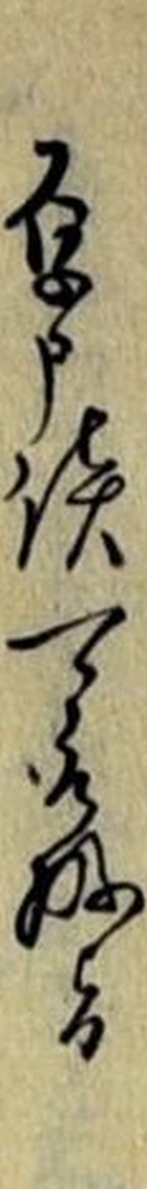厚申談可取扱旨
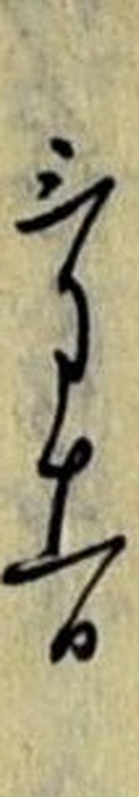三月十一日
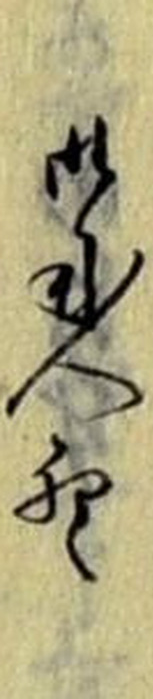御用人初へ
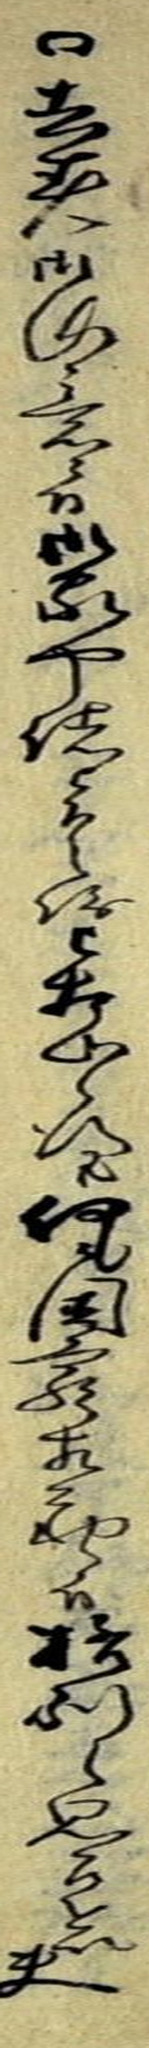○去春御趣意ニ付御家中諸被下之儀被相止候得共何も困窮相勤候ニ付格別之思召を以夫
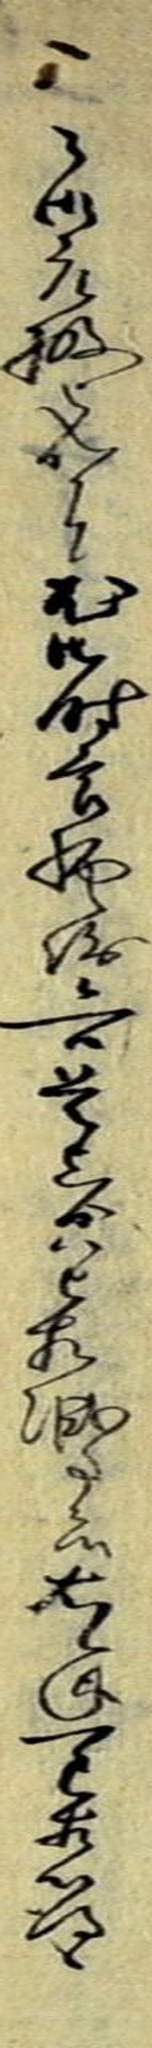々御取扱被成下候尤御時節柄之儀候ヘハ是迄ゟハ相減事ニ候右之趣可被相心得候
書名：命令之部 三
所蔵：福井県文書館 Fukui Prefectural Archives
